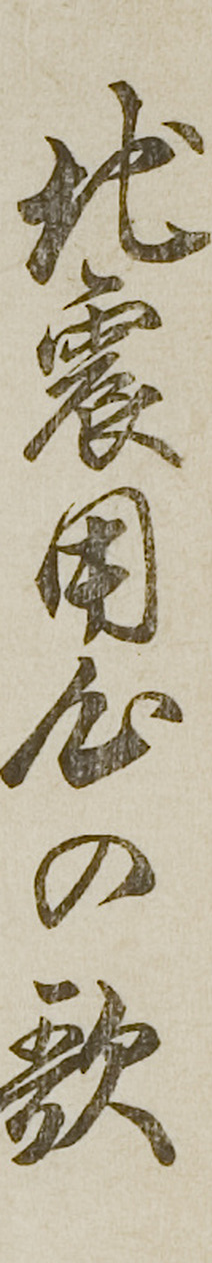地震用心の歌
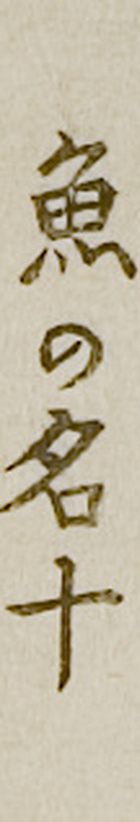魚の名十
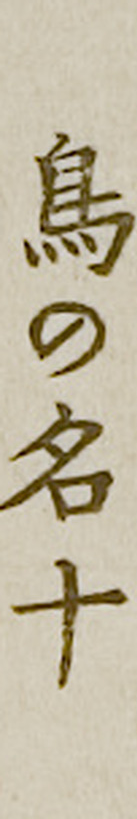鳥の名十
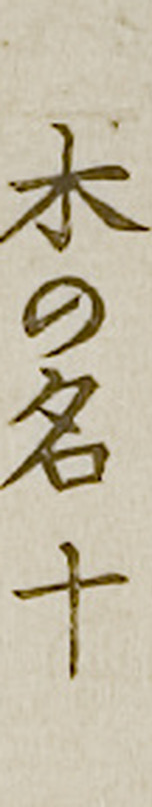木の名十
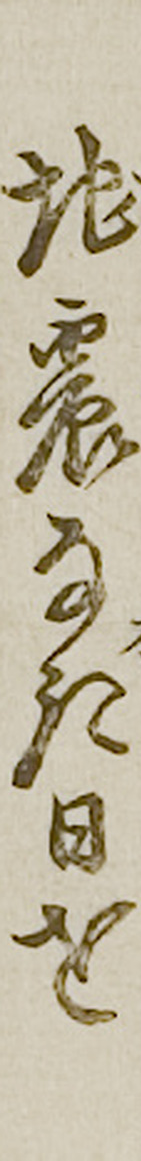地震なき日を
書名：地震用心の歌
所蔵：東京大学総合図書館 General Library in the University of Tokyo, JAPAN
